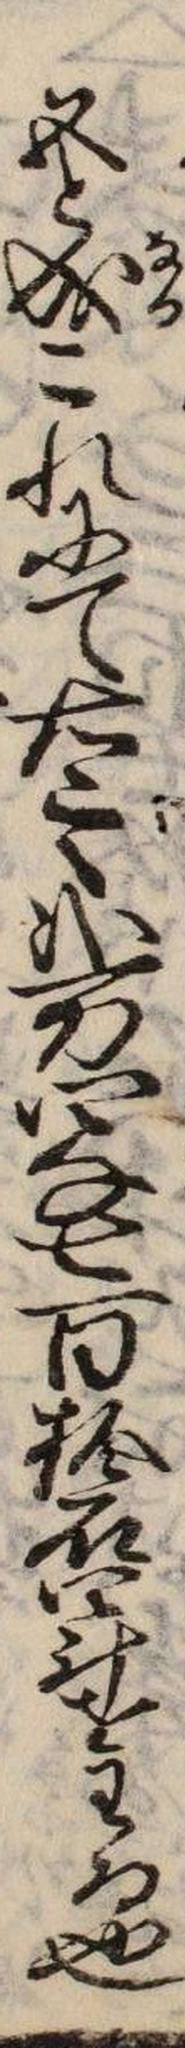五と成これにて右の弐万四千七百拾石四斗をわる也
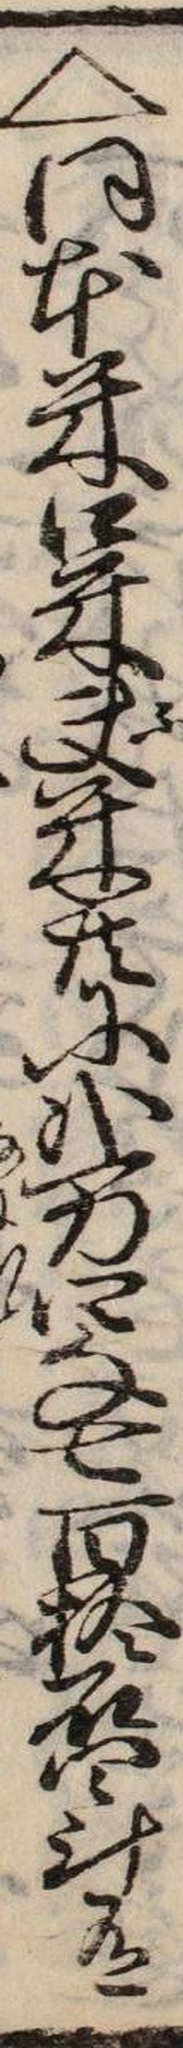△同本米口米夫米共に弐万四千七百拾石四斗有
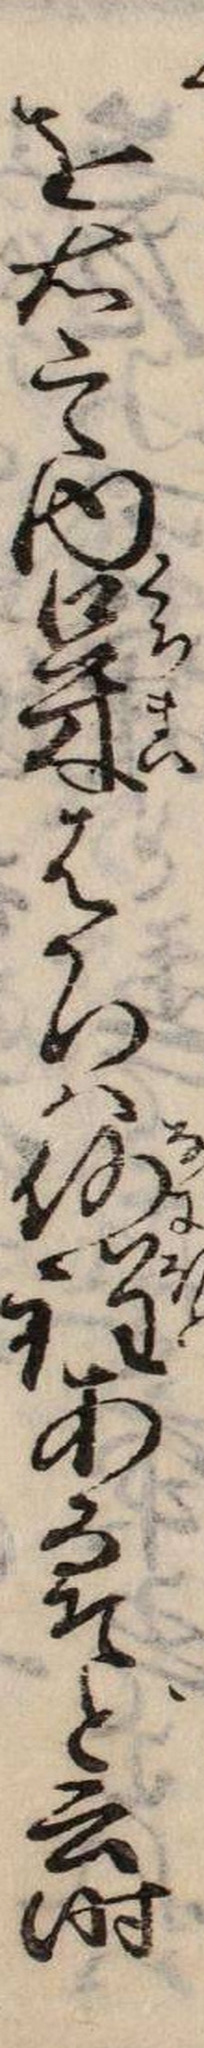を右の内口米はかりは何程あるそと云時
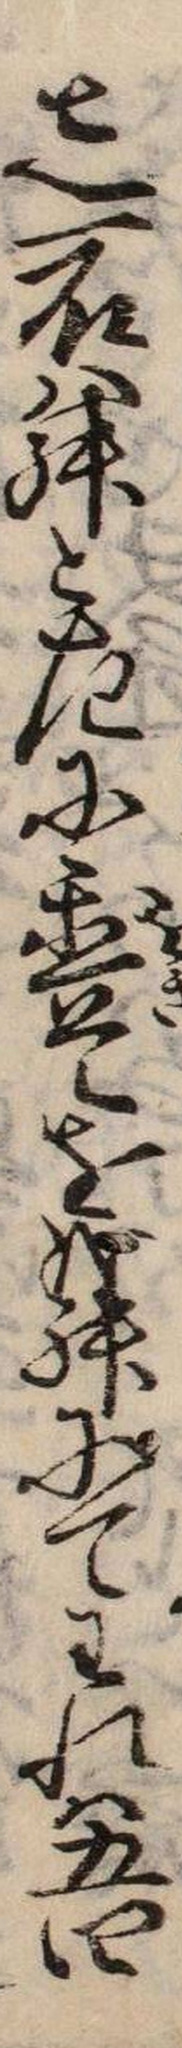先一石八舛と左に置是を弐舛にてわれは五四
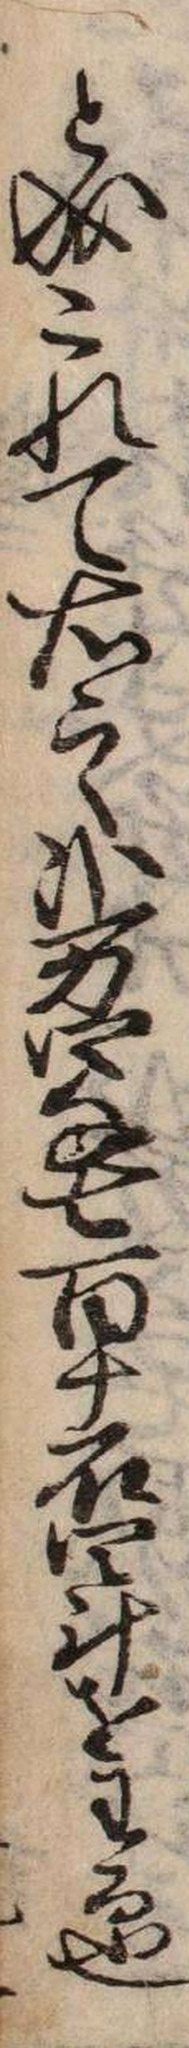と成これて右の弐万四千七百十石四斗をわる也

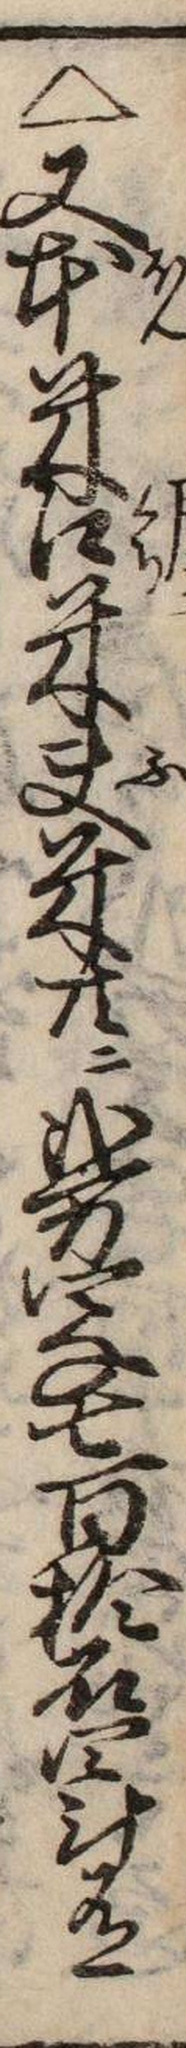△又本米口米夫米共に弐万四千七百拾石四斗有
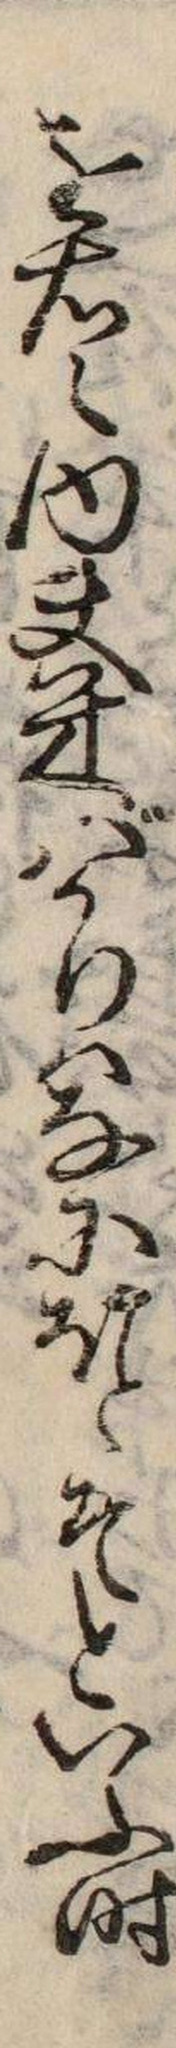を右の内夫米ばかりはなにほとそといふ時
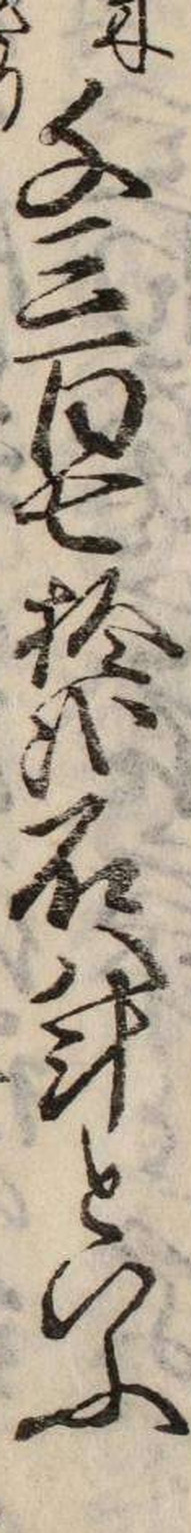夫米千三百七拾弐石八斗といふ
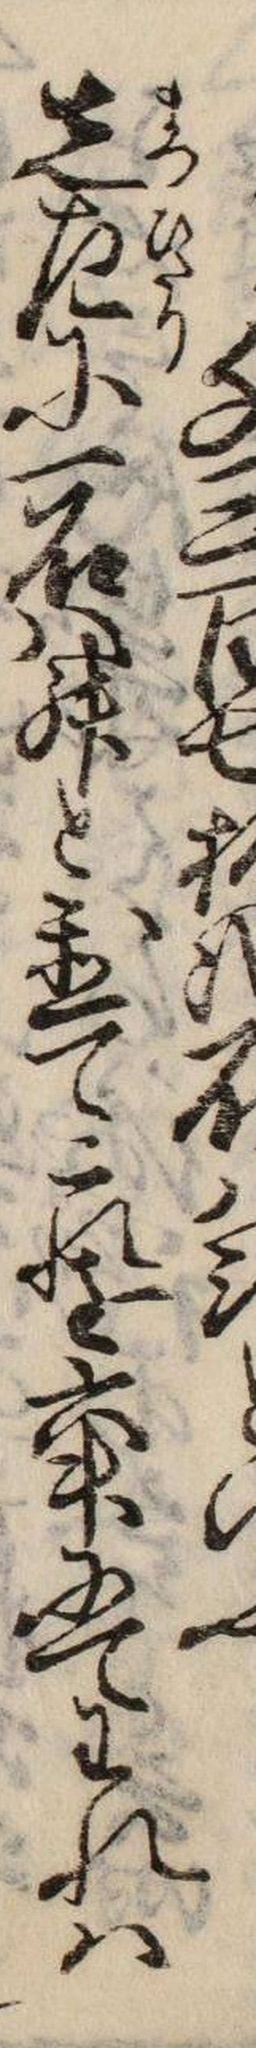先左に一石八舛と置てこれを六升にてわれは
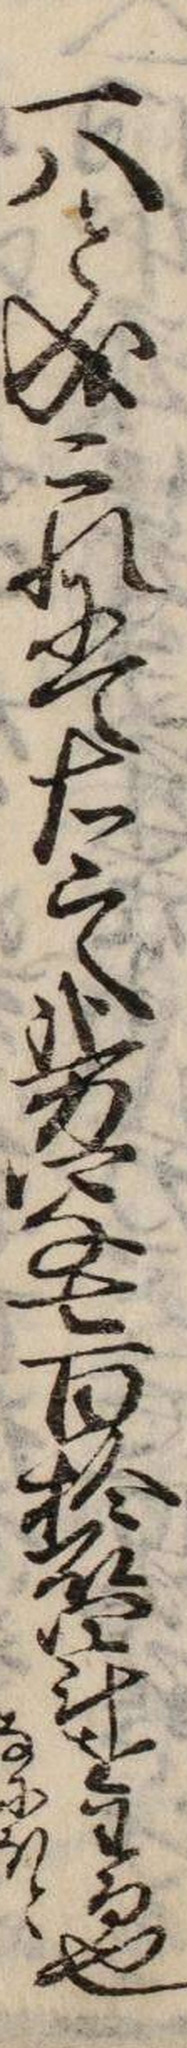一八と成これにて右の弐万四千七百拾石四斗をわる也
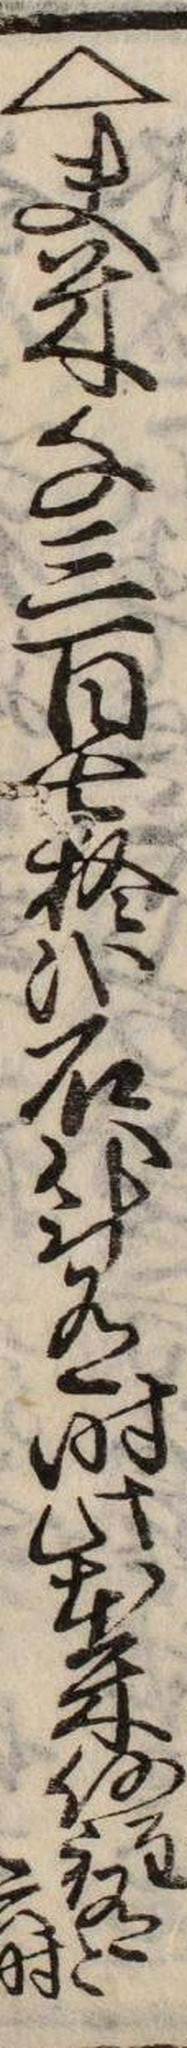△夫米千三百七拾弐石八斗有時此本米何程有と云時
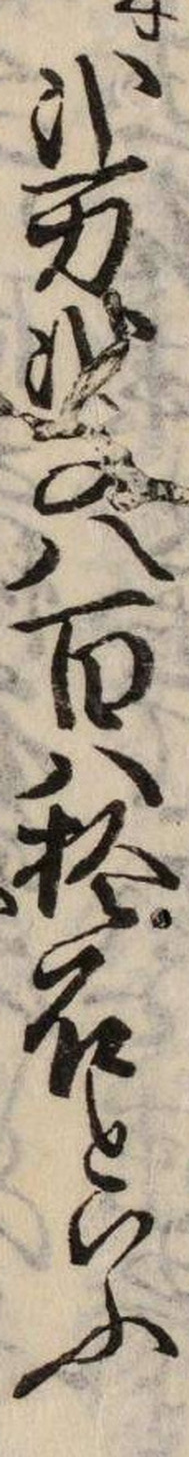本米弐万弐千八百八拾石といふ
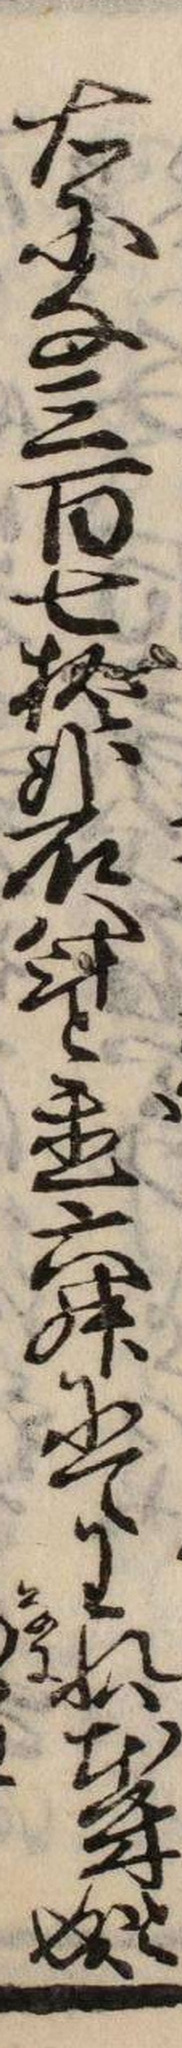右に千三百七拾弐石八斗と置六舛にてわれは本米と成
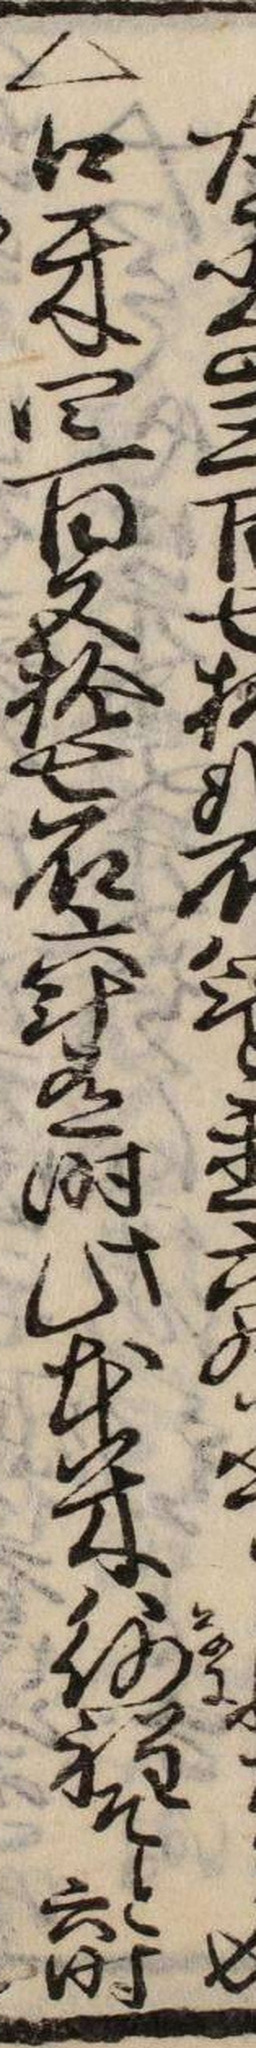△口米四百五拾七石六斗有時此本米何程そと云時
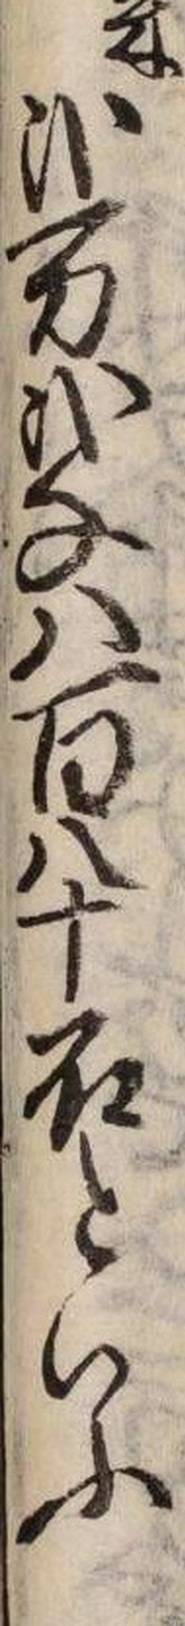本米弐万弐千八百八十石といふ
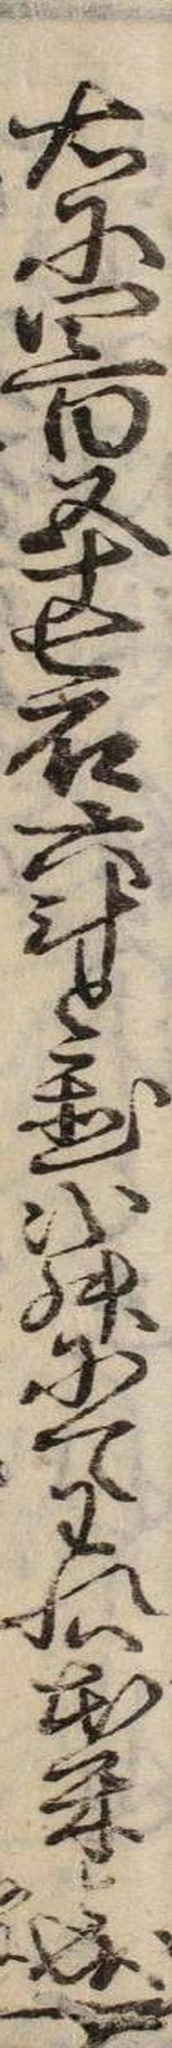右に四百五十七石六斗と置弐舛にてわれは本米と成
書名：塵劫記（寛永11年自跋、京都府立京都学・歴彩館追貴8）
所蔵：京都府立京都学・歴彩館 国文学研究資料館
